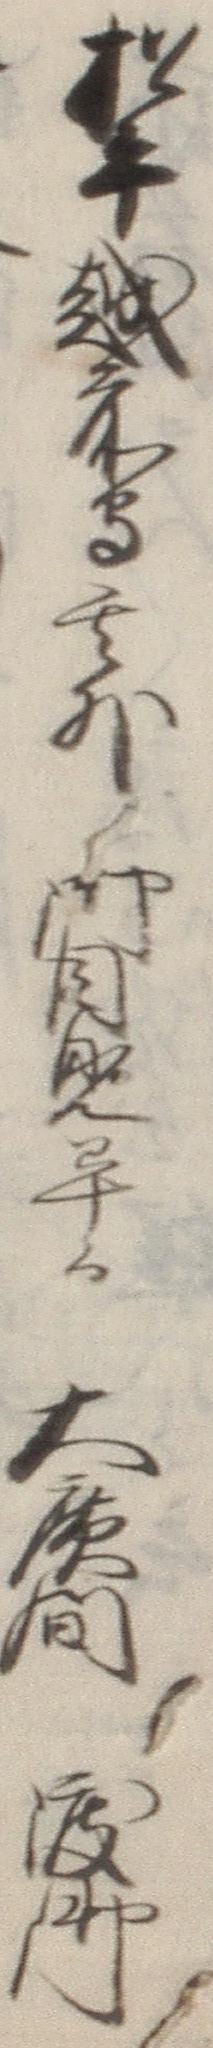松平越前守其外御目見畢而大広間渡御
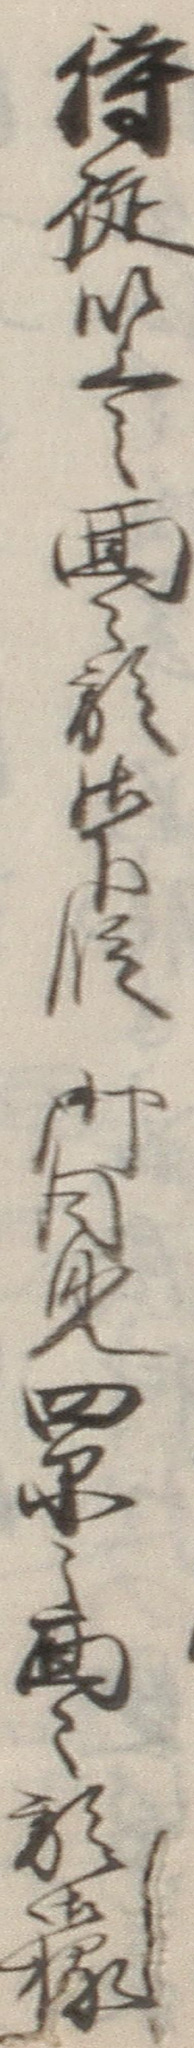侍従以上之面々於御下段御目見四品の面々於御縁
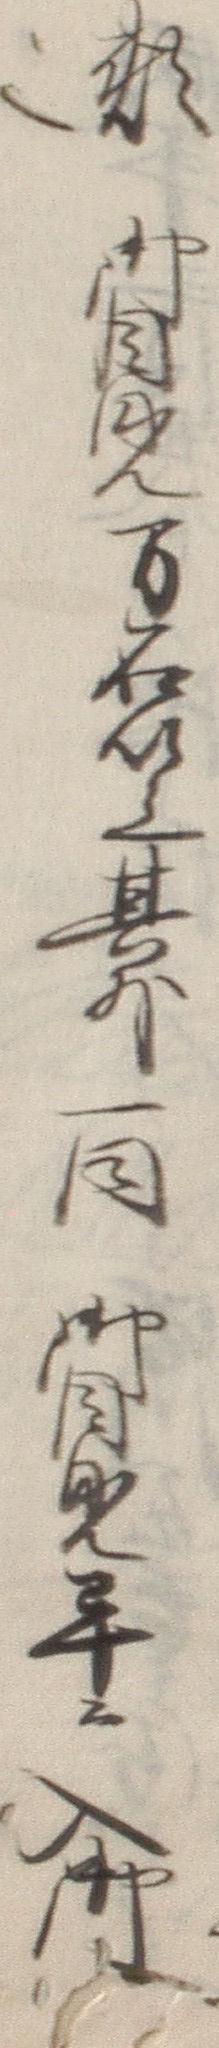頬御目見万石以上其外一同御目見畢而入御
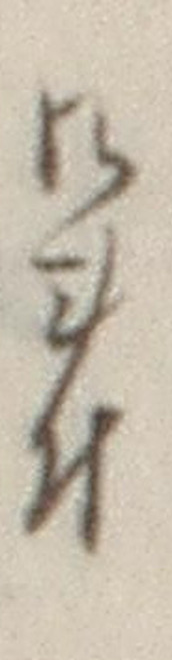御書付
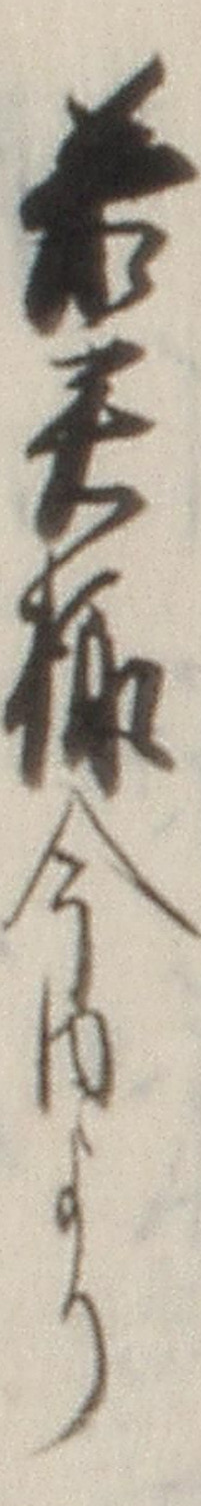若君様今日より
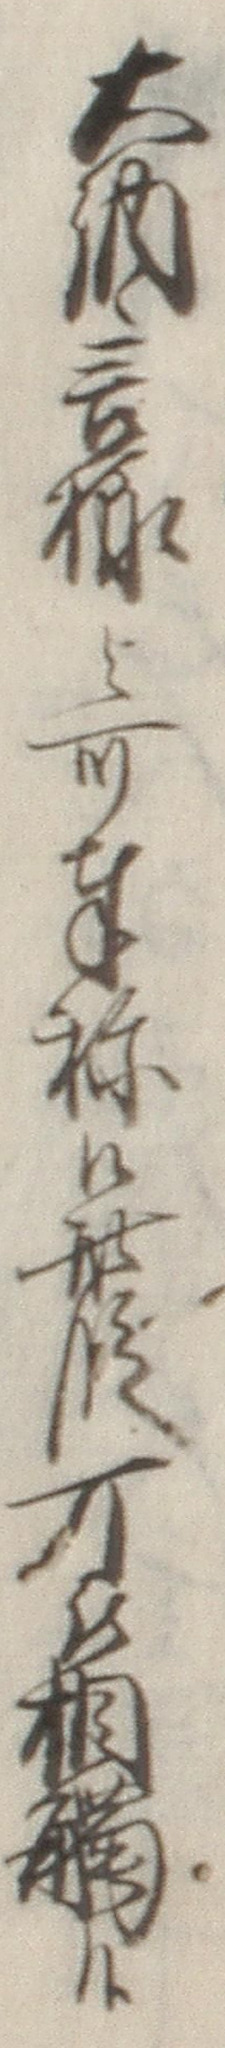大納言様と可奉称候此段可被相触候
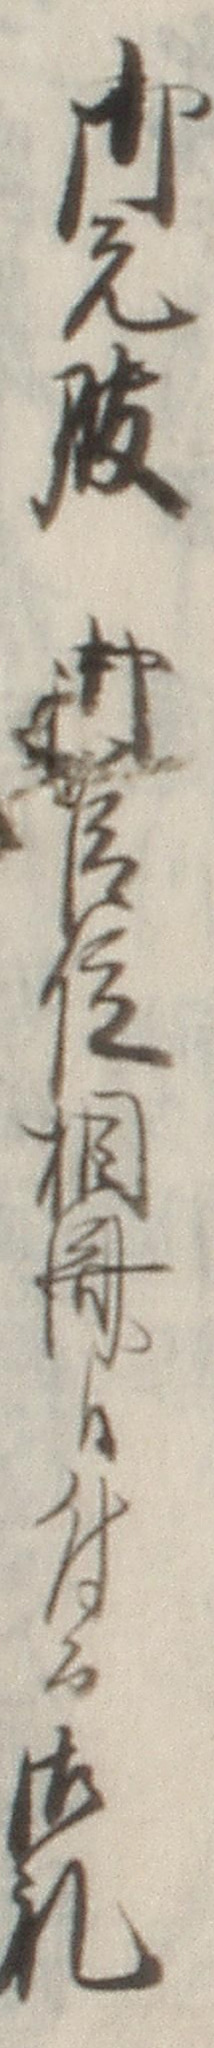御元服御官位相済候付而御礼
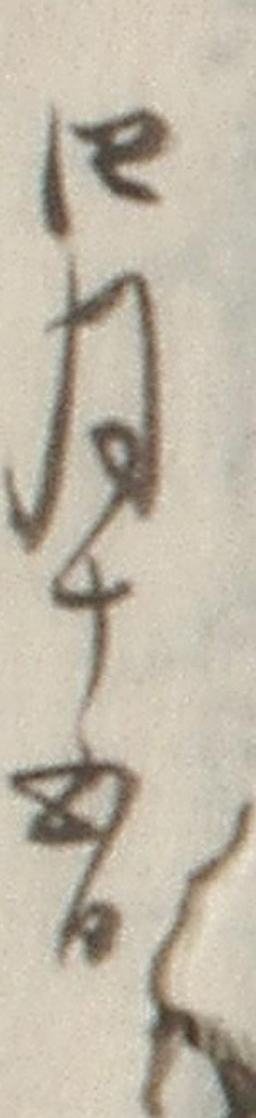四月十五日
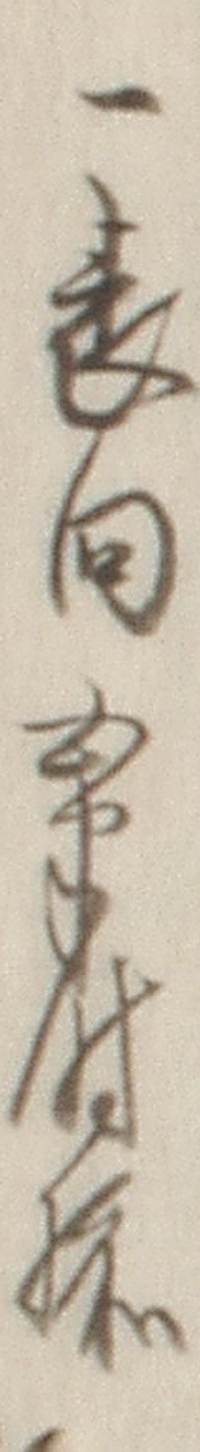一表向五半時前
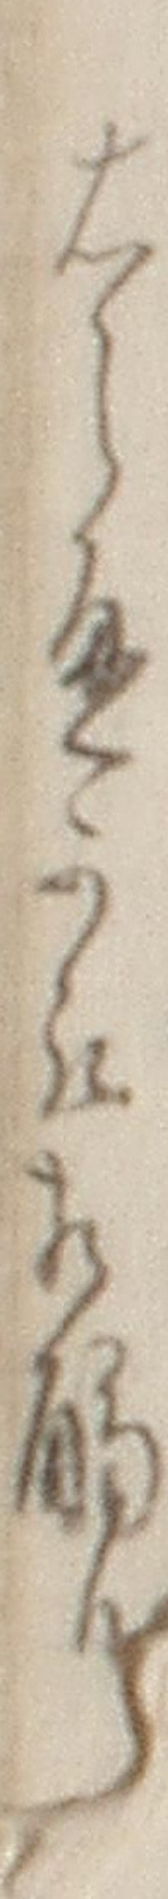右の通可被相触候

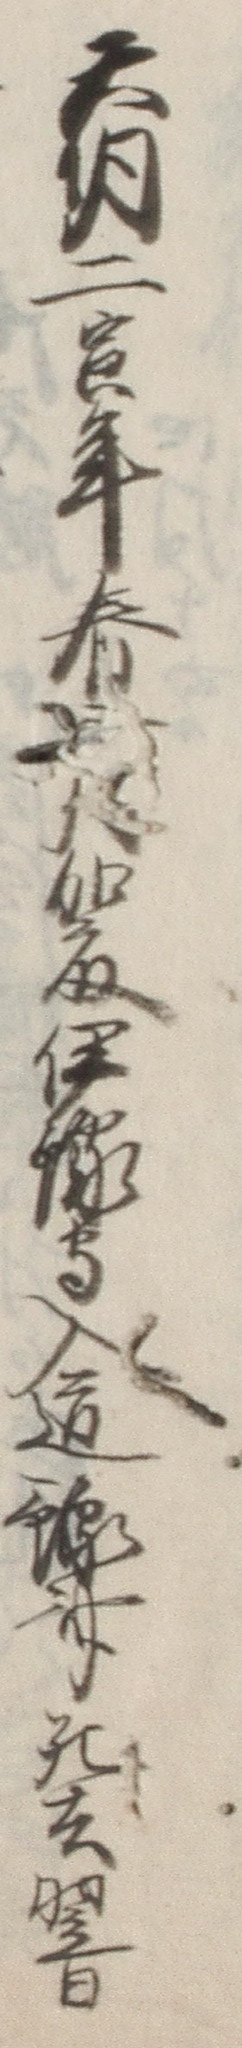天明二寅年春加藤伊予守入道与斎死去翌日
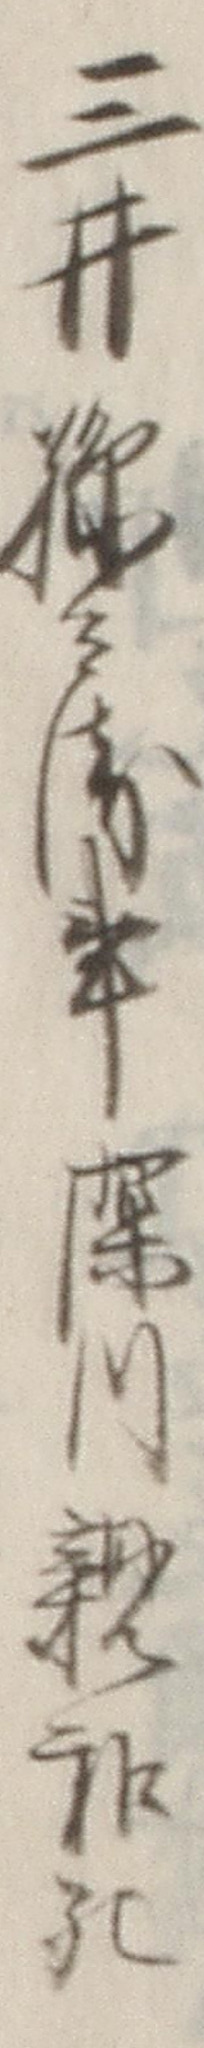三井孫兵衛事深川親類死
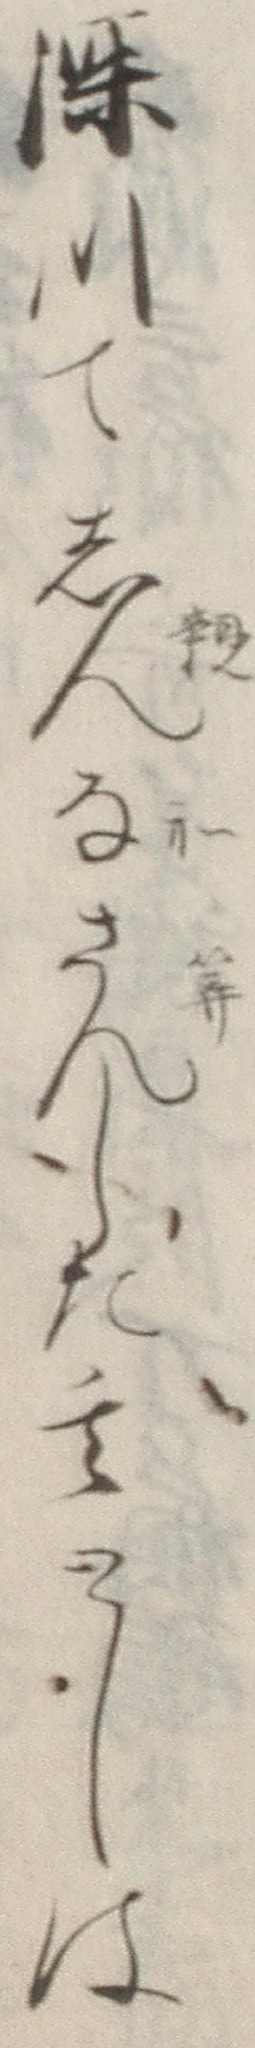深川てしんなさんした其としは
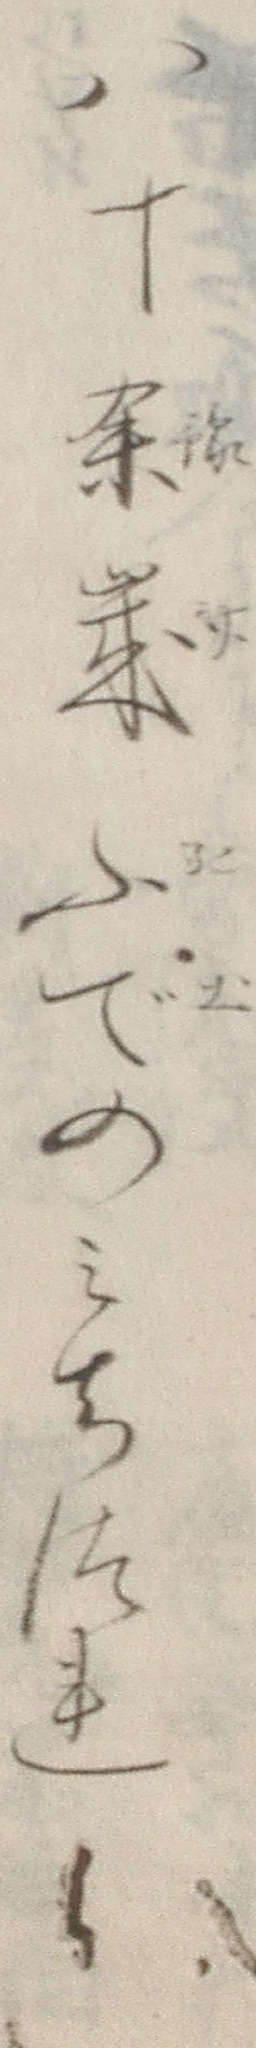八十余才ふでのみちつれ
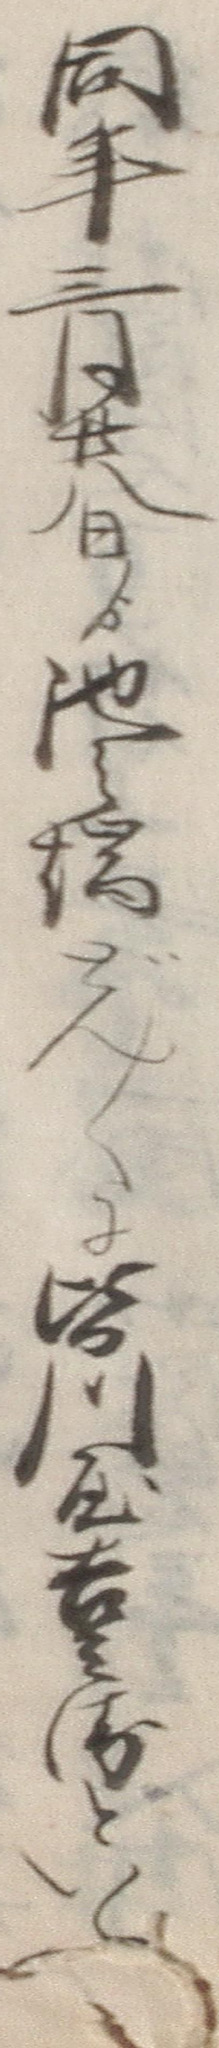同年三月廿八日ゟ池の端どん〳〵にて皆川屋吉兵衛といふ
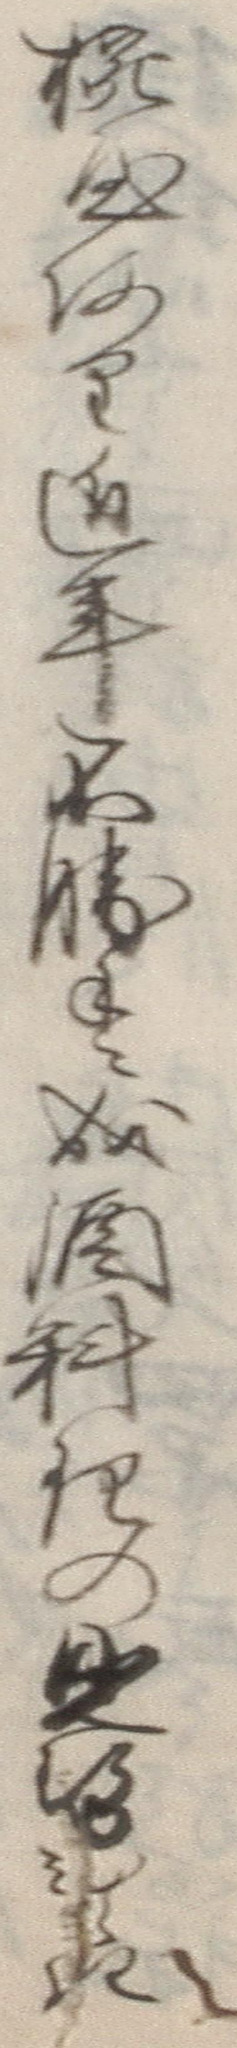鱣屋あり近年不勝手二成酒料理のみせひらき
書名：[諸国災害記録]
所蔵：東京大学地震研究所図書室 Earthquake Research Institute Library, The University of Tokyo, JAPAN
